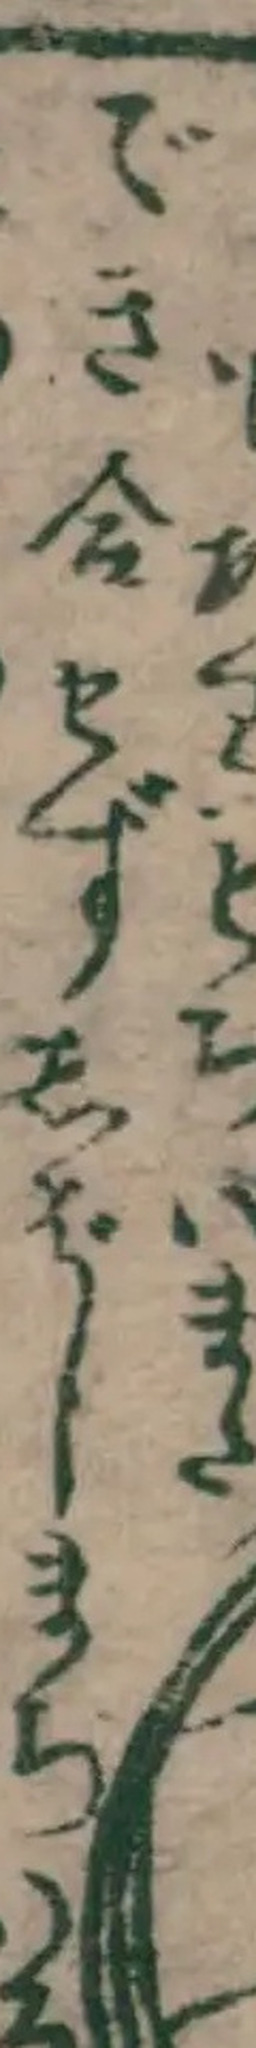でき合せずしばしまちいる
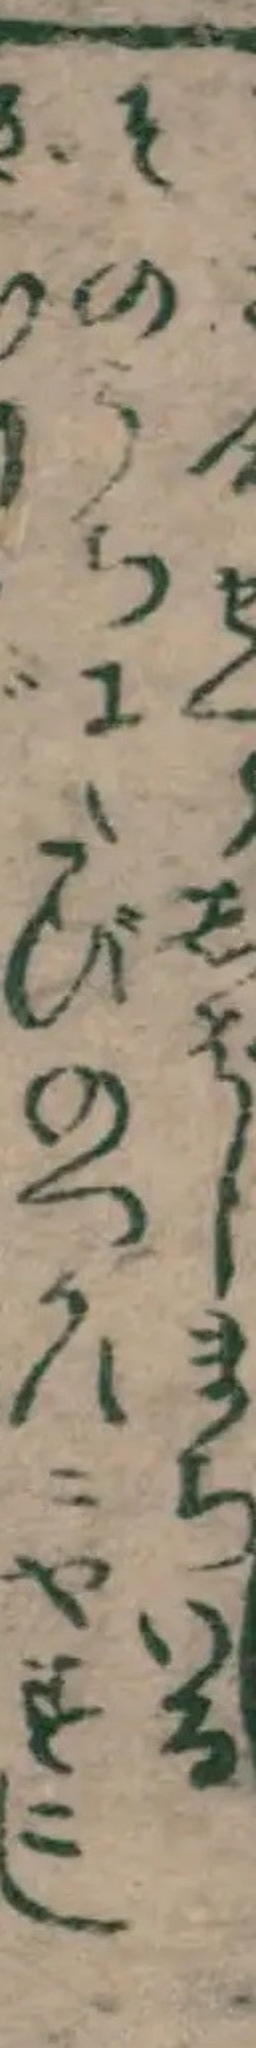そのうちにたびのつかれにやすこし
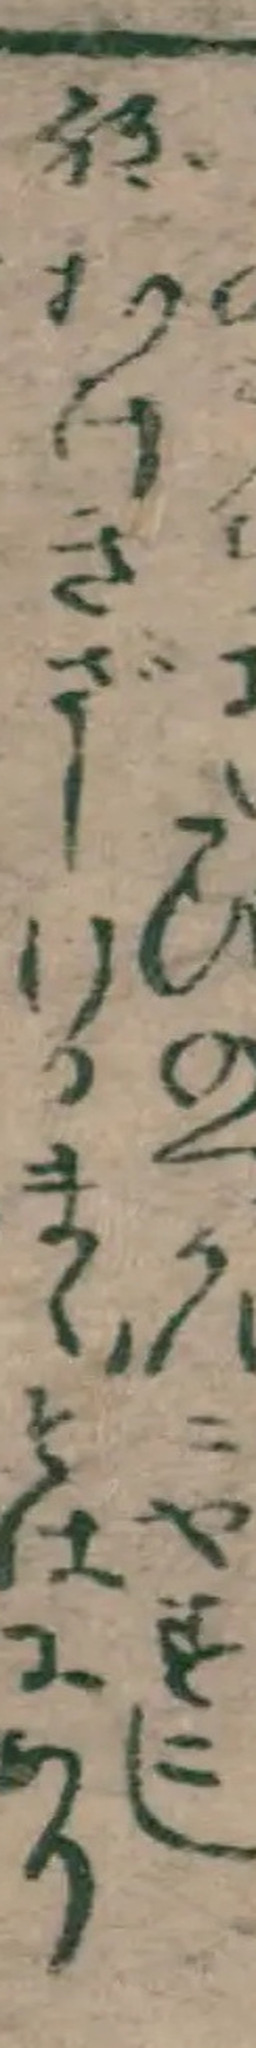ねむけきざしけるまゝそはにあり
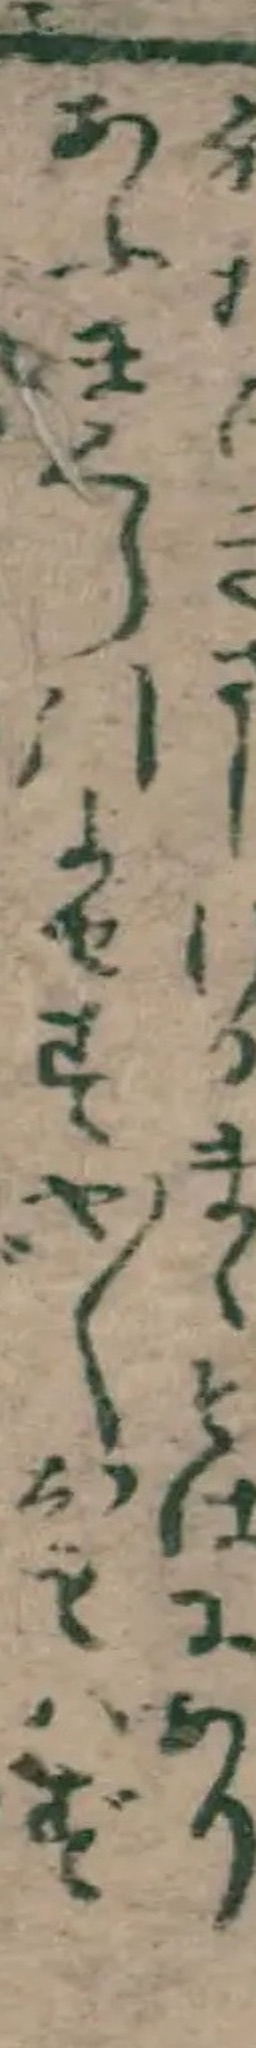あふまくら引よせすや〳〵おもはず
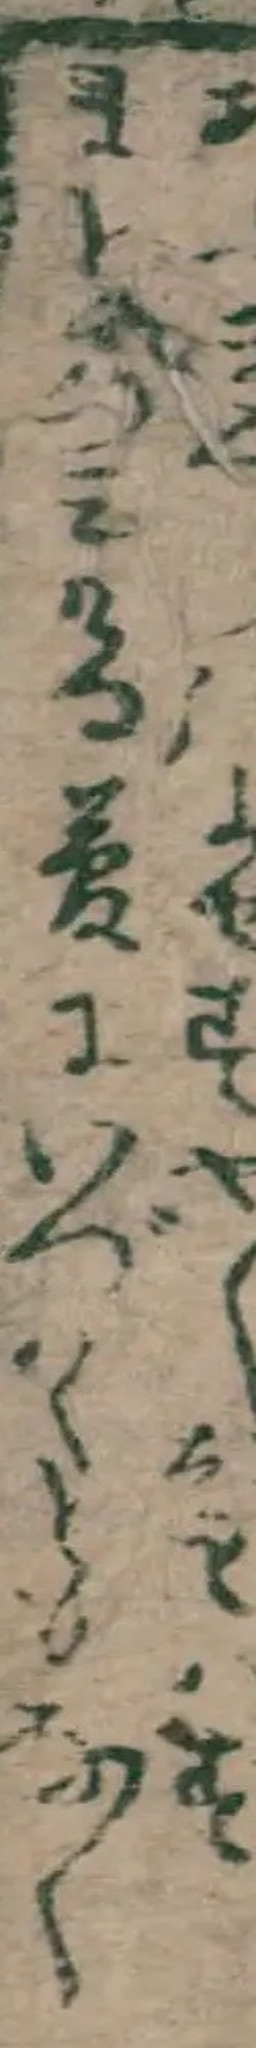まとろみける夢にいづくともなく
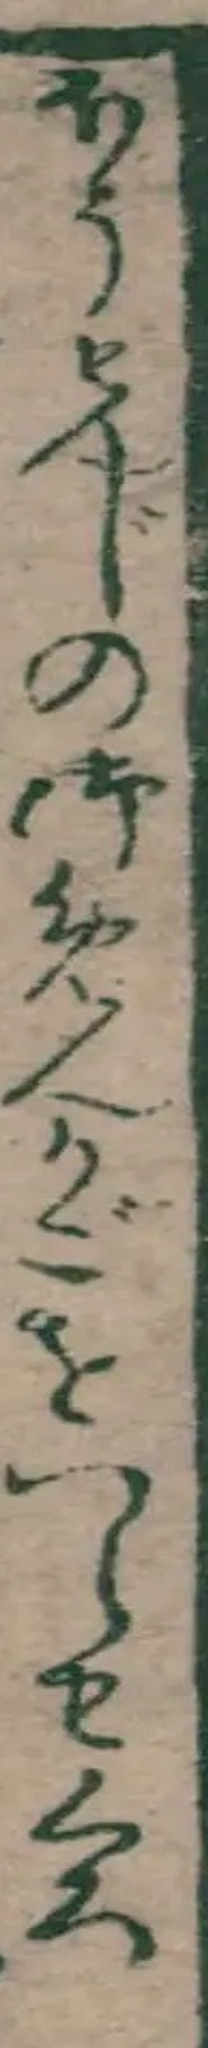ほうせんじの御めんかごをい？ら？せくろ
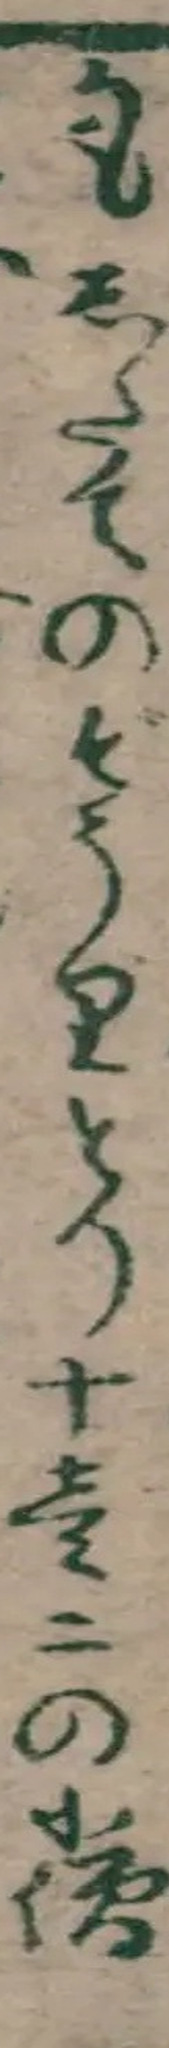かもしたてのぞうりとり十壱二の小僧
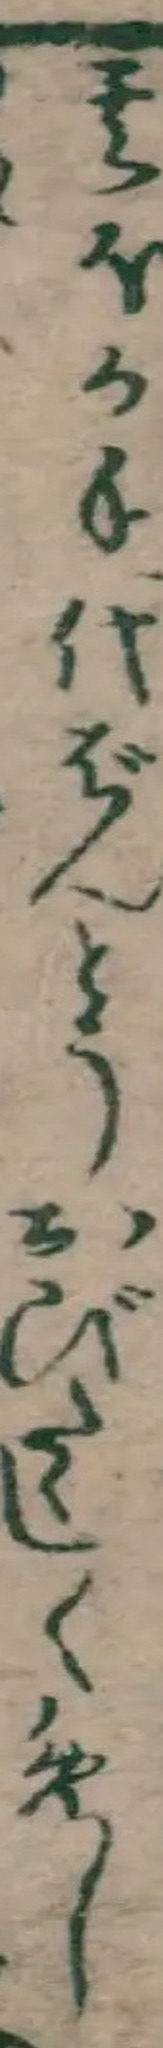其ほか手代ばんとうおびたゝしくめし
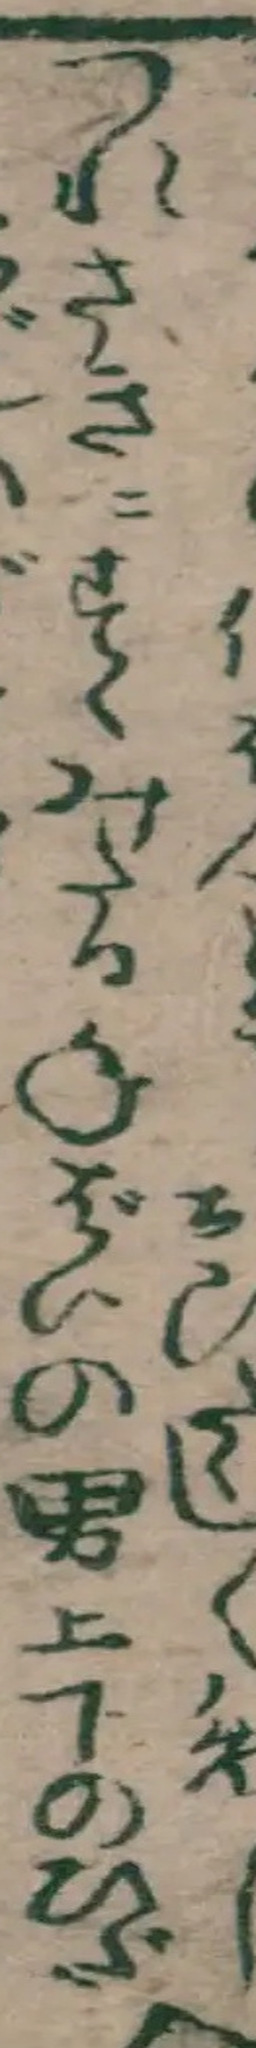つれさきにすゝみたる手だいの男上下のひざ
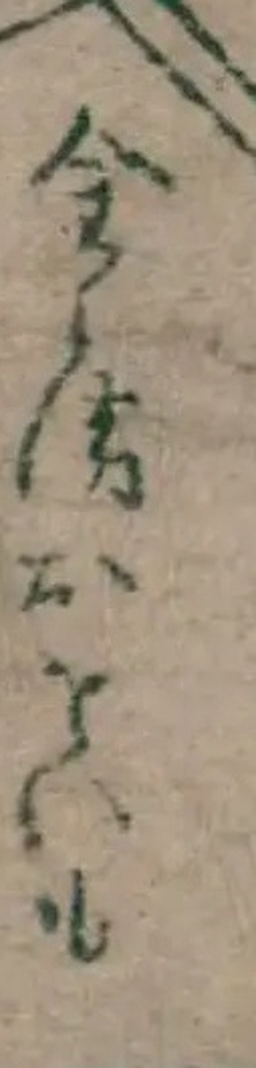金兵衛おもいも
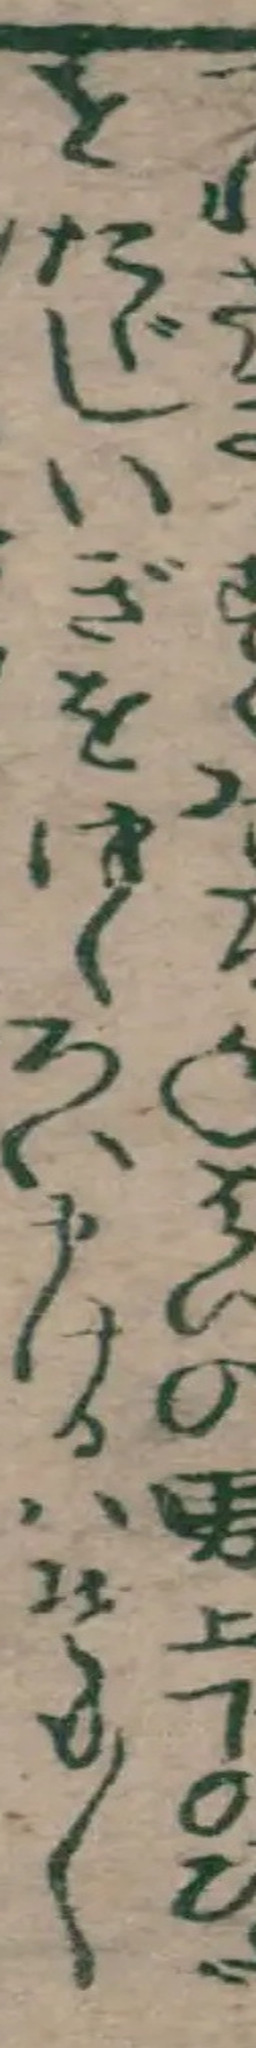をたゞしいぎをつくろい申けるはそも〳〵
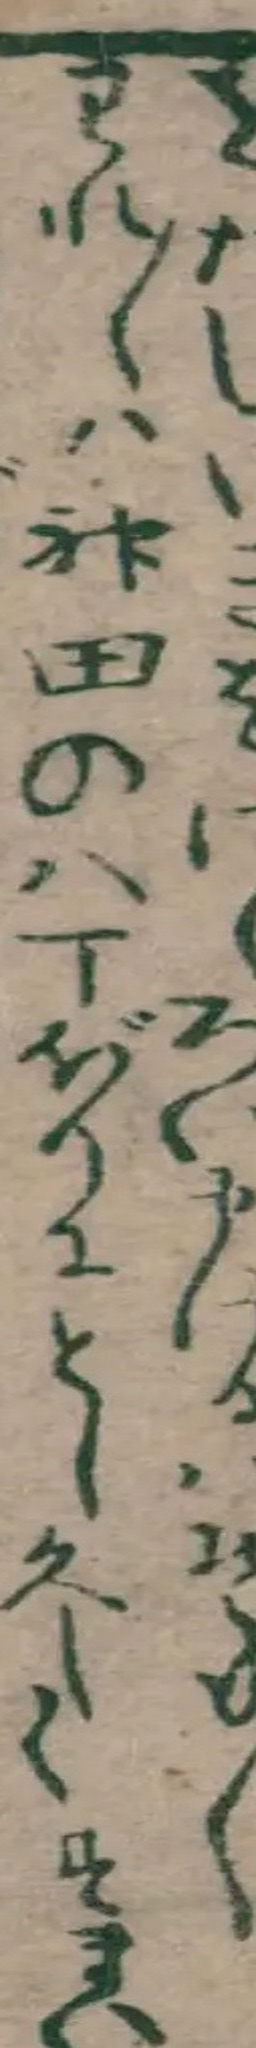われ〳〵は神田の八丁ぼりにとし久しくすまい
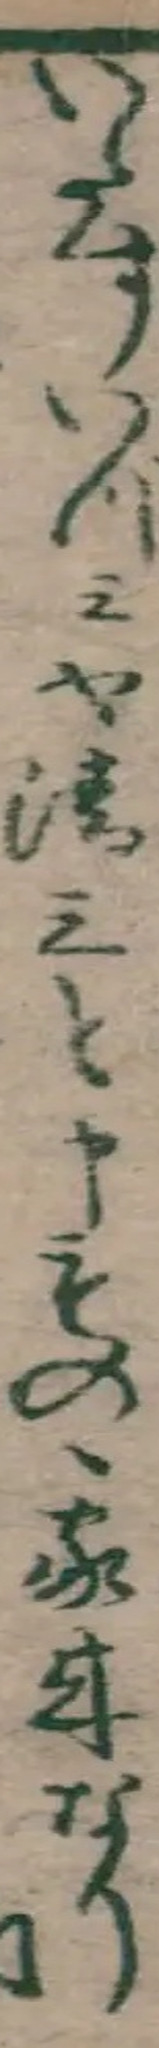いたすいづみや清三と申ものゝ家来なり
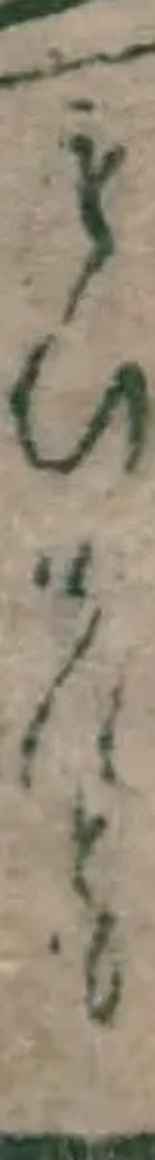もひけれとも
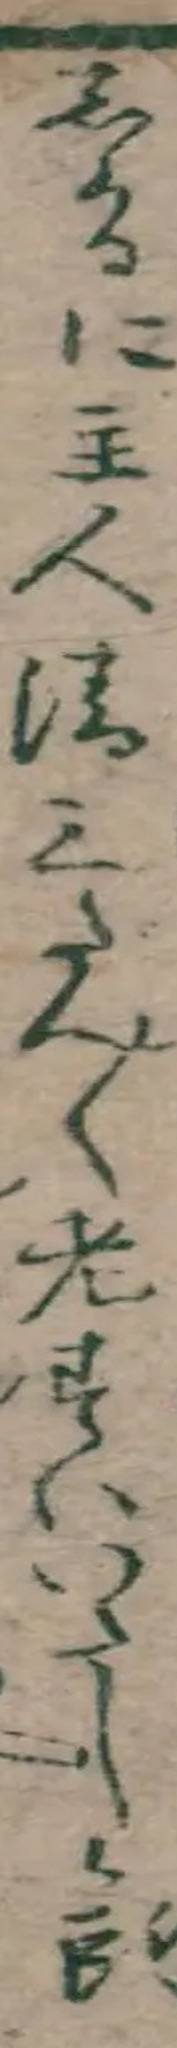しかるに主人清三たん〳〵老すいいたし候所
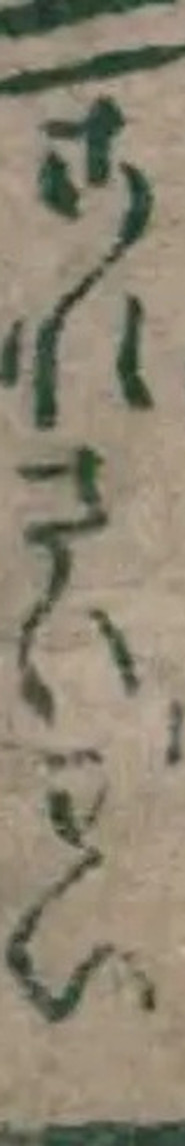これさいわい
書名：金々先生栄花夢 : 2巻
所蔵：国立国会図書館 National Diet Library, JAPAN
